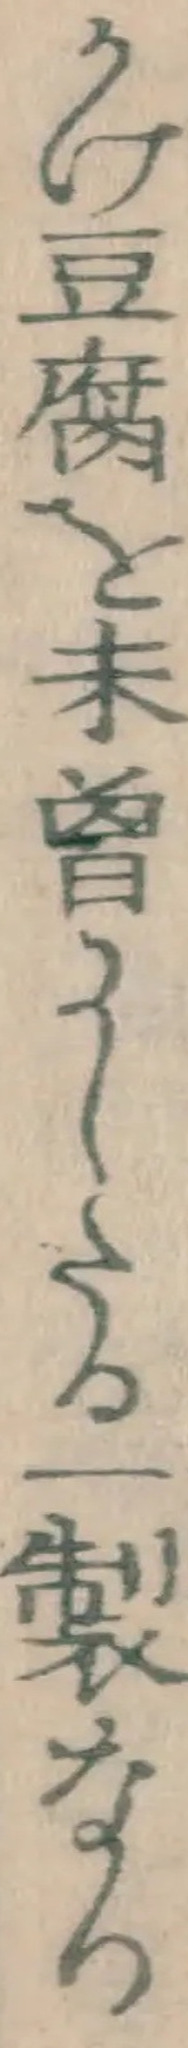かけ豆腐を未曽にしたる一製なり
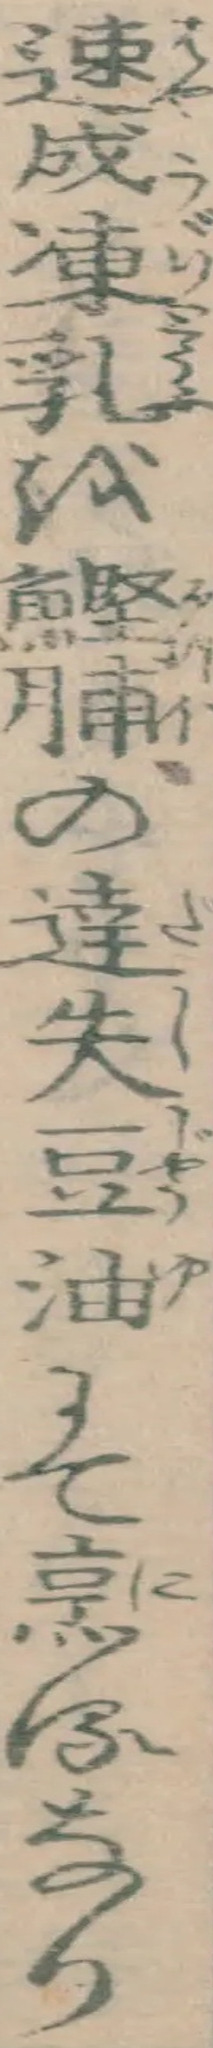速成凍乳を鰹脯の達失豆油にて烹るなり
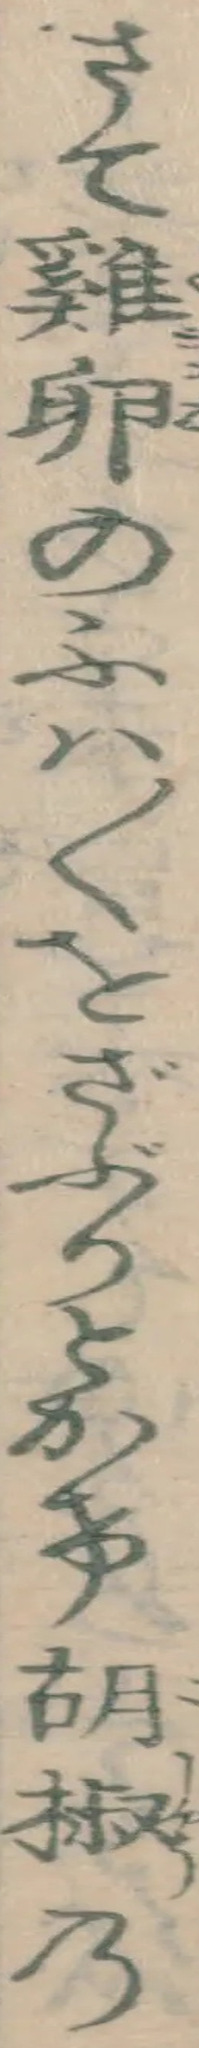さて鶏卵のふは〳〵をざぶりとかけ胡椒の
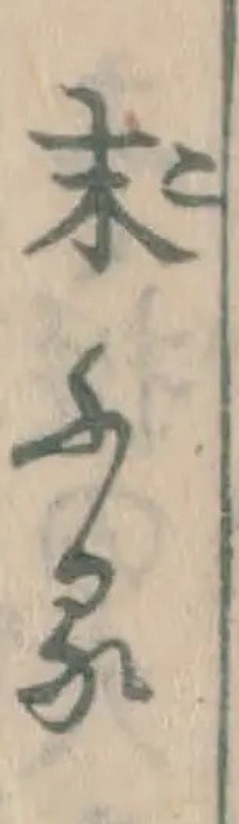末ふる
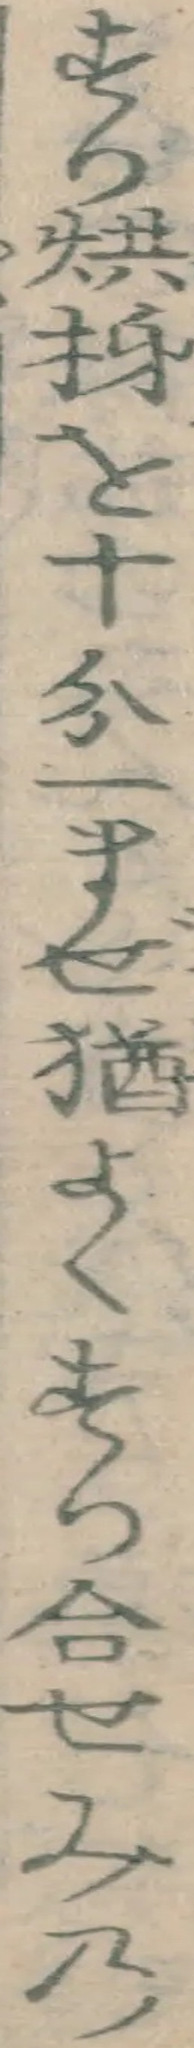すり烘柿を十分一まぜ猶よくすり合せみの
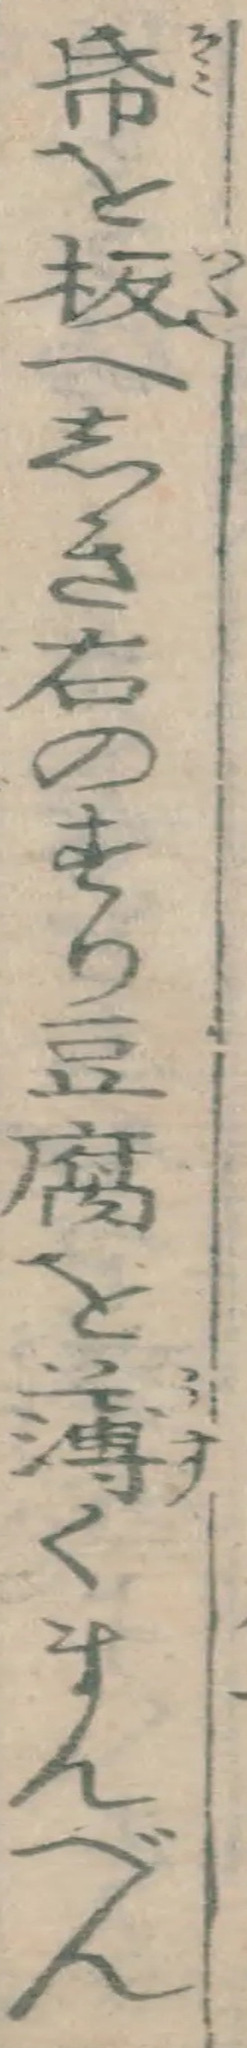紙を板へしき右のすり豆腐を薄くまんべん
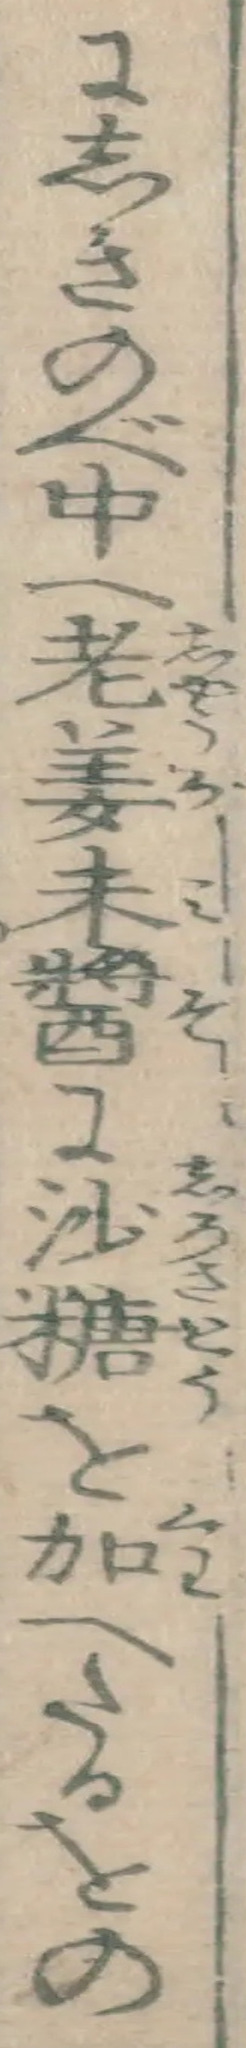にしきのべ中へ老姜未醤に沙糖を加へたるをの
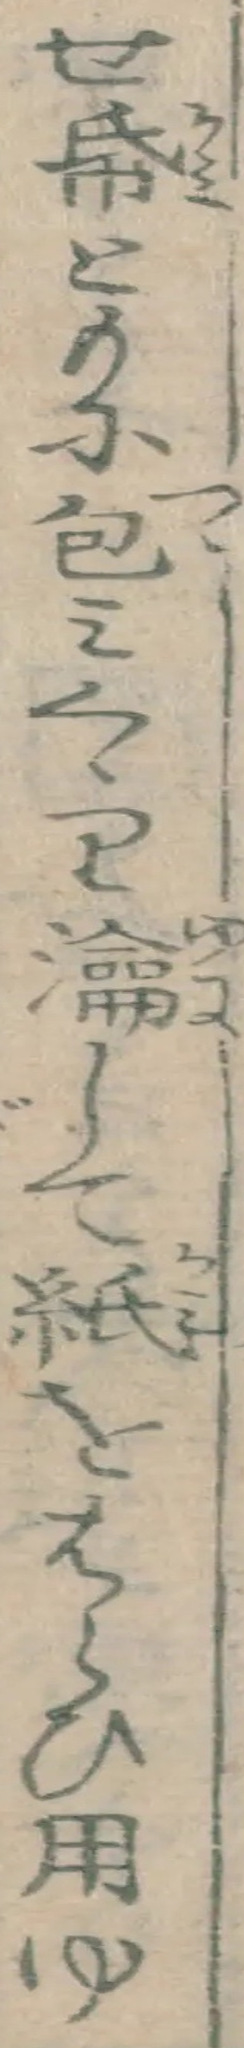せ紙ともに包みくゝり瀹して紙をはらひ用ゆ
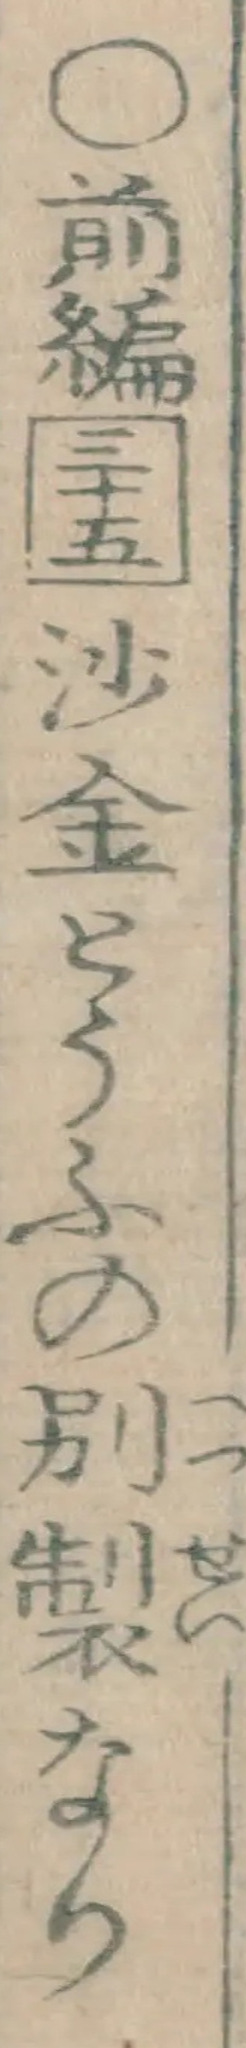○前編三十五沙金豆腐の別製なり

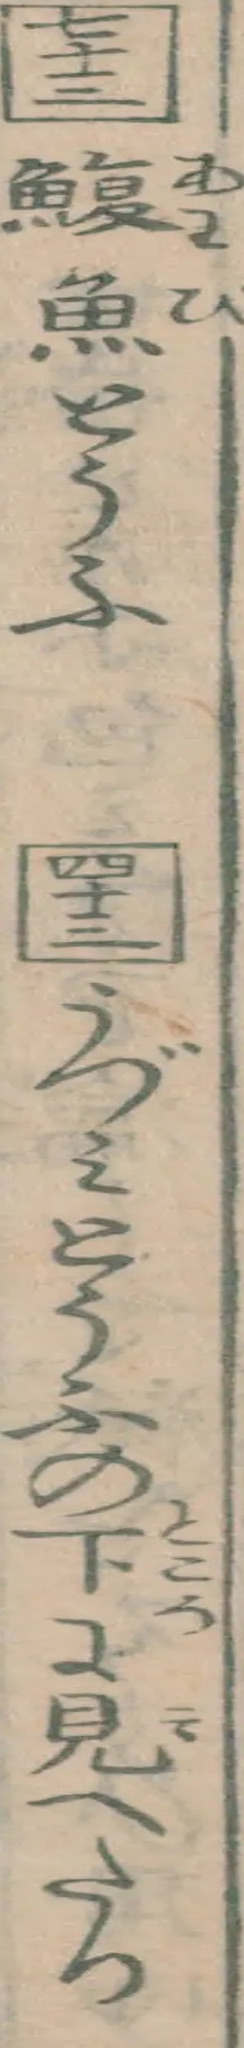七十三鰒魚とうふ四十三うづみとうふの下に見へたり
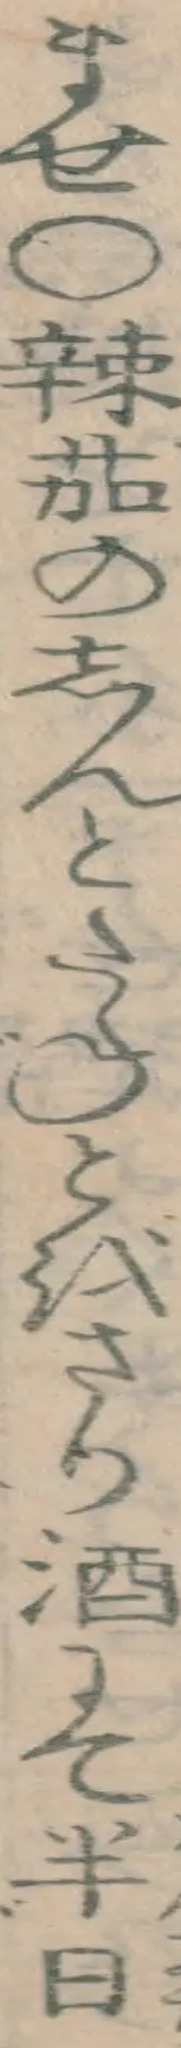ませ○辣茄のしんとたねとをさり酒にて半日
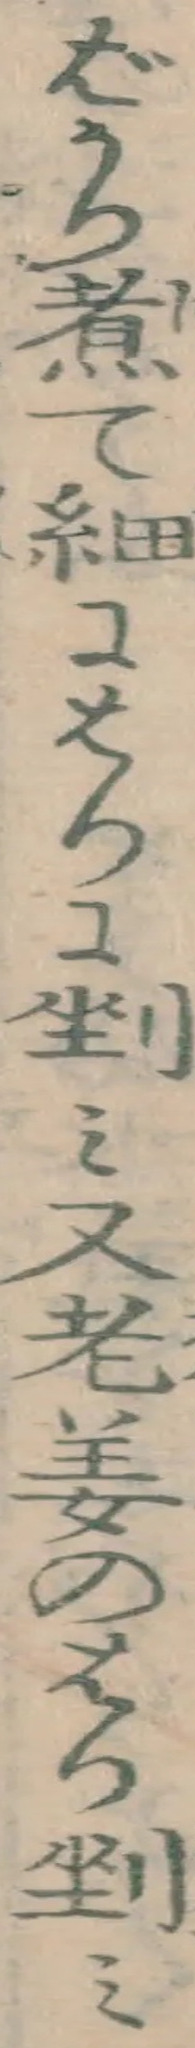ばかり煮て細にはりに剉み又老姜のはり剉み
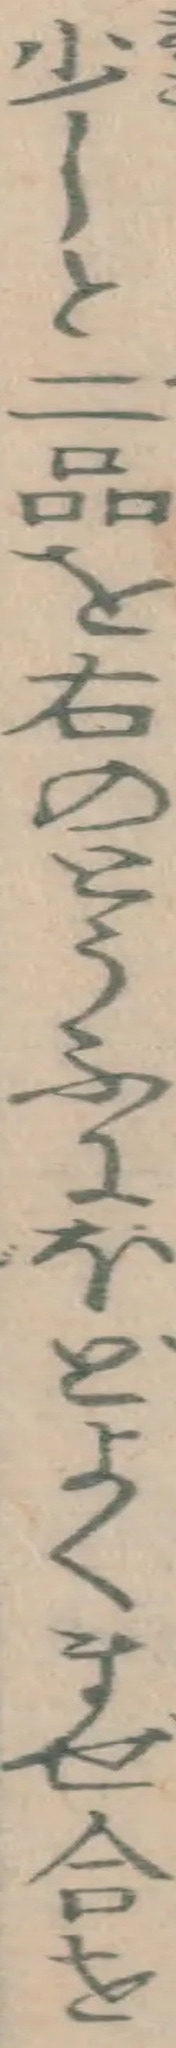少しと二品を右のとうふにほどよくまぜ合せ
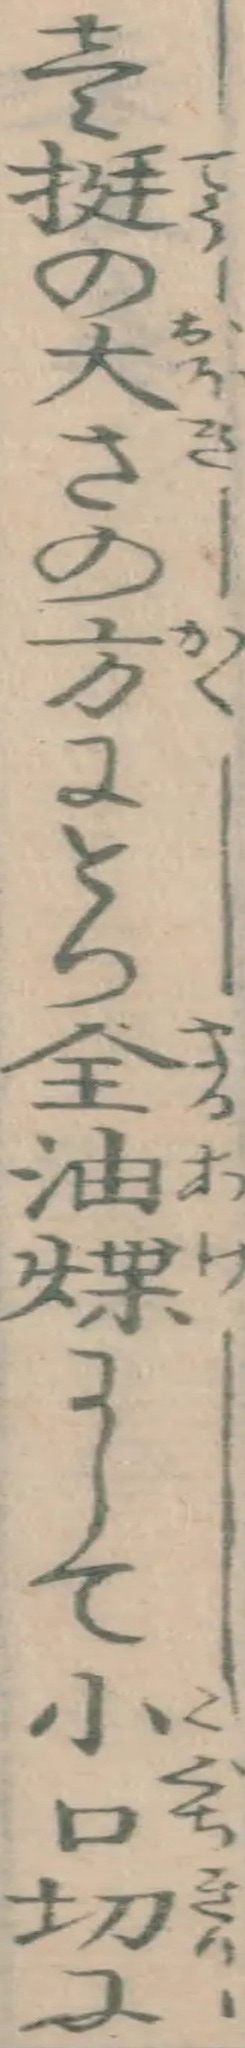壱挺の大さの方にとり全油煠にして小口切に
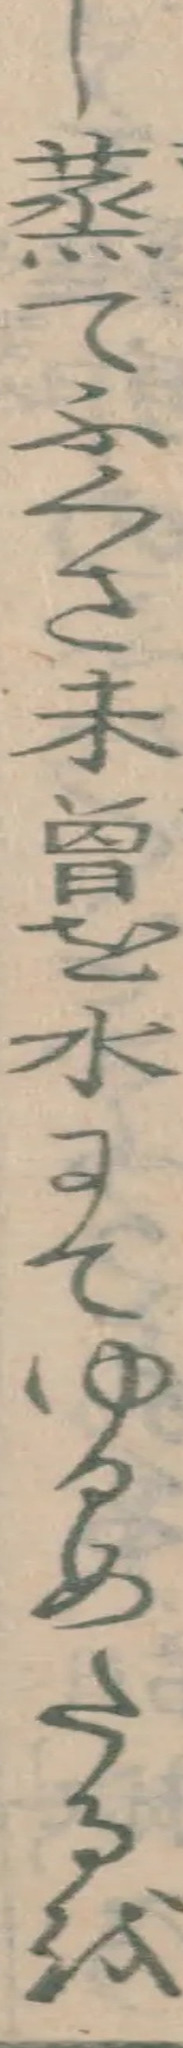し蒸てふくさ未曽を水にてゆるめたるを
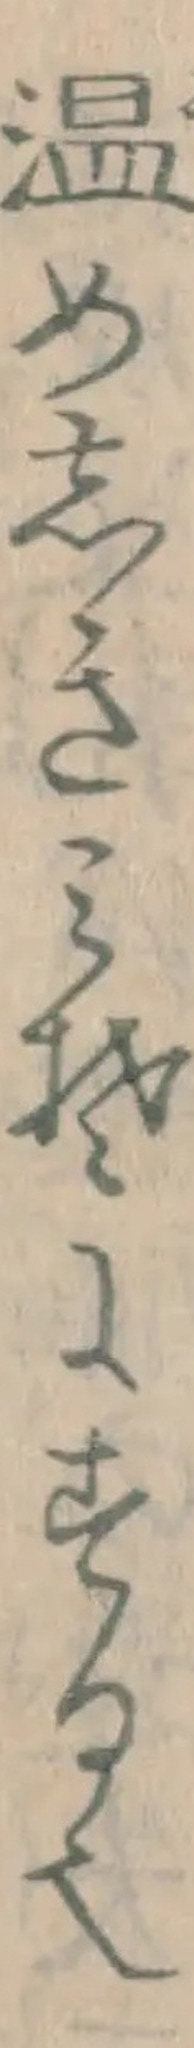温めしきみそにする也
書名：豆腐百珍. 続編
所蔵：国立国会図書館 National Diet Library, JAPAN
